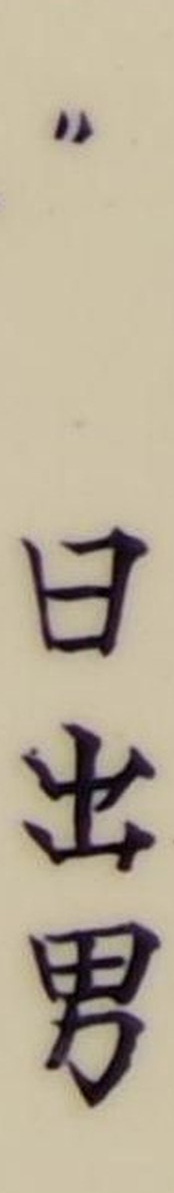日出男
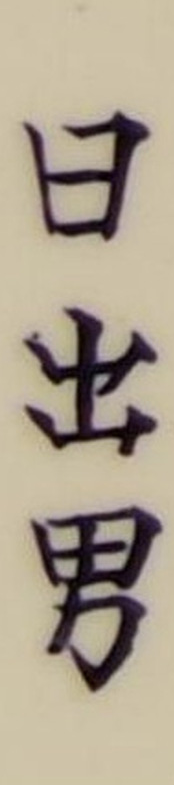日出男
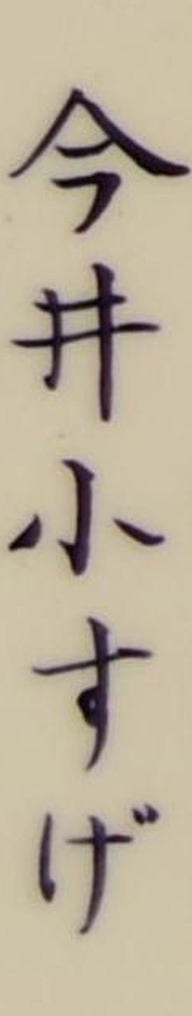今井小すげ
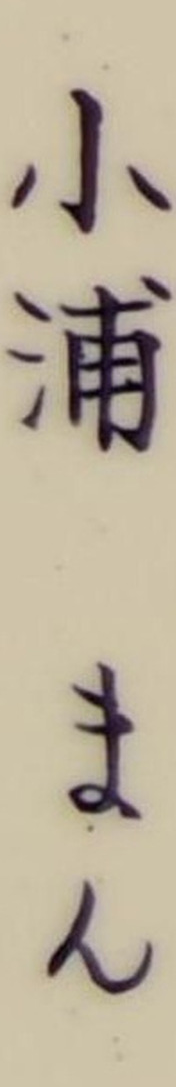小浦まん
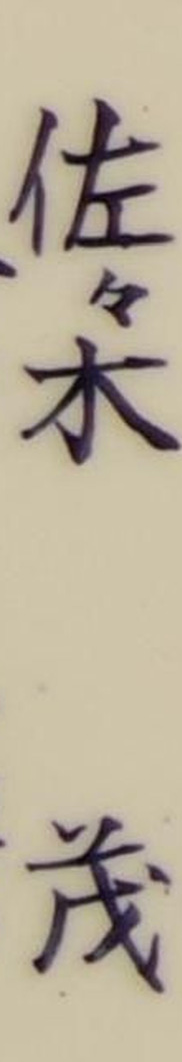佐々木茂
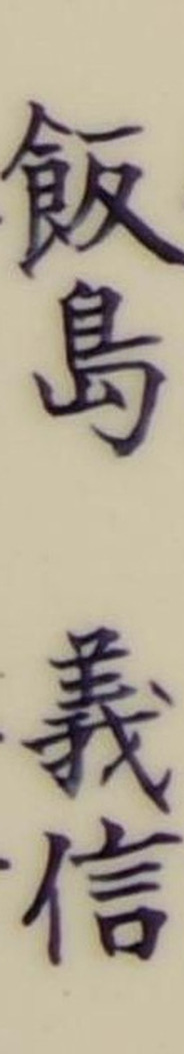飯島義信
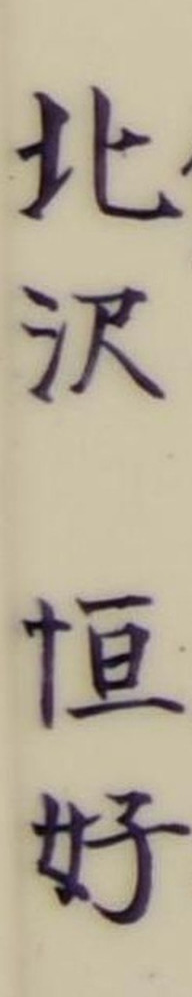北沢恒好

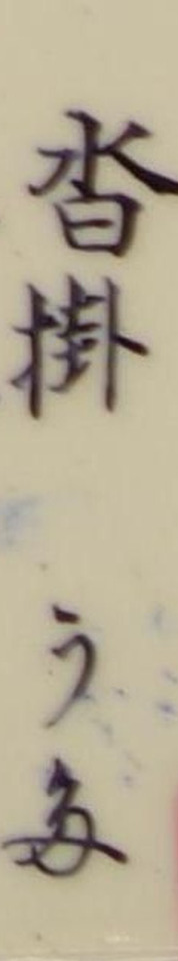沓掛うた
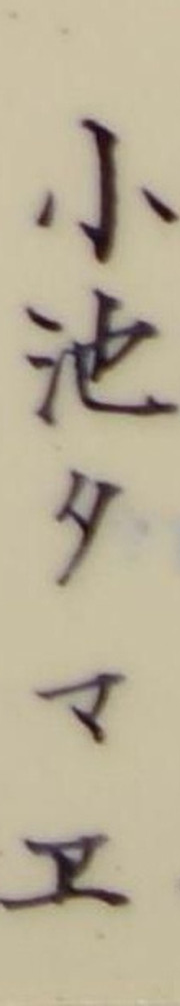小池タマヱ
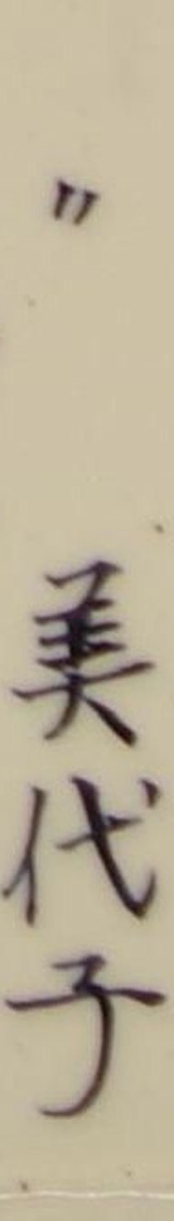美代子
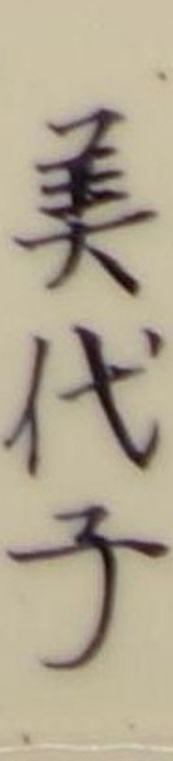美代子
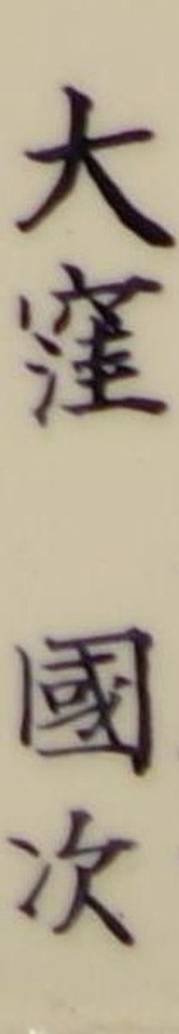大窪国次
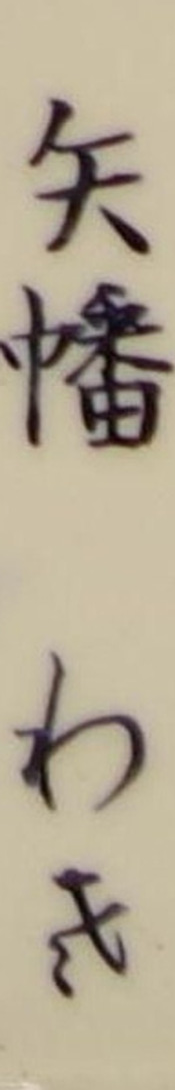矢幡わき
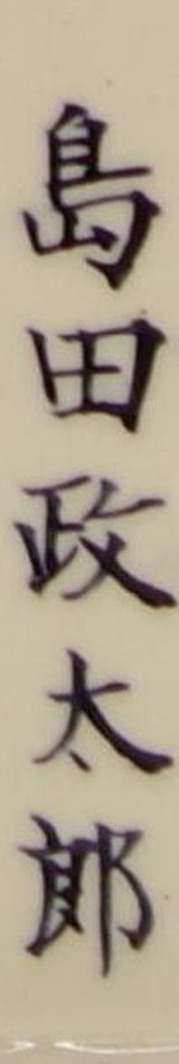島田政太郎
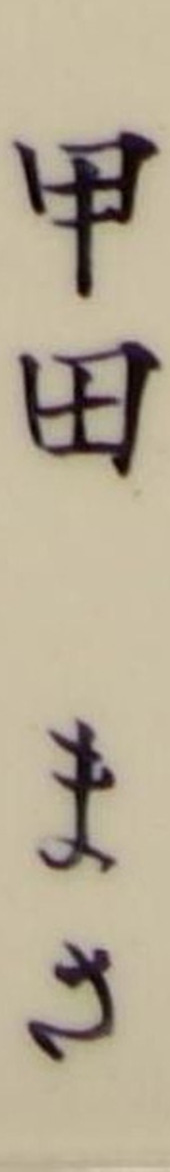甲田まさ
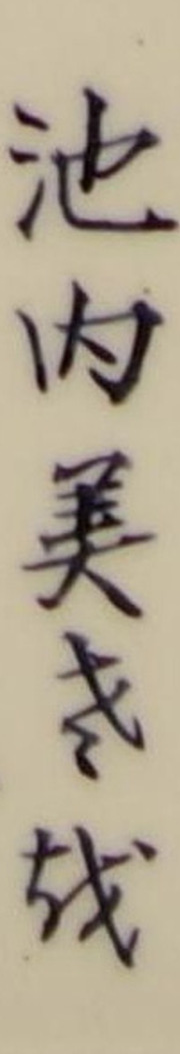池内みさを
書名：E~L
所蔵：高野山金剛峯寺
